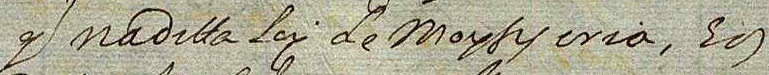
q̄ na ditta ley de Moyses cria, E os
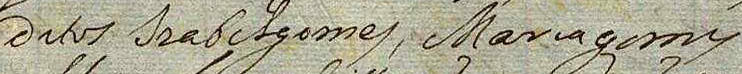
ditos Izabel gomes, Maria gomes
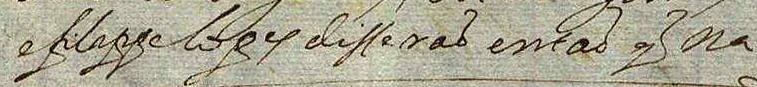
e filippe lopes disseraõ entaõ q̄ na
